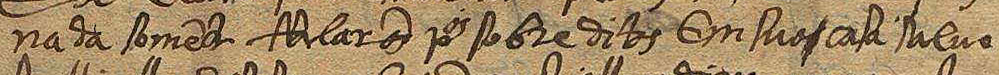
nada somēte fallarā pas sobreditas Em suas casa saluo
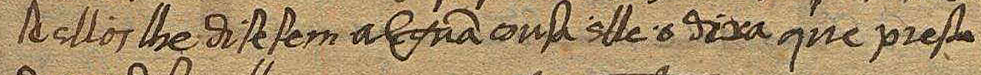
se ellas lhe disesem alguā cousa elle o dira que presto
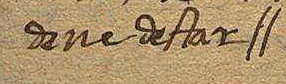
deue destar //
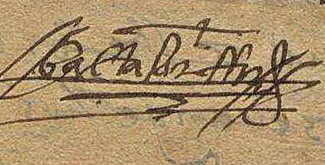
baltasar ffrz
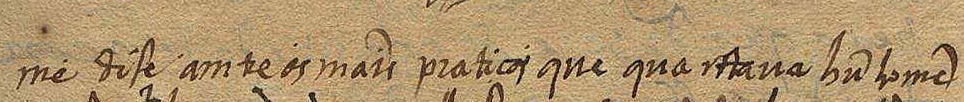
me dise amtre as mais praticas que qua estaua hū homē
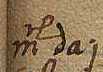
meL da
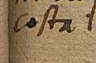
costa
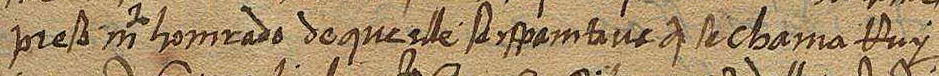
preso mto homrado de que Elle se espamtaua q̄ se chama Ruy
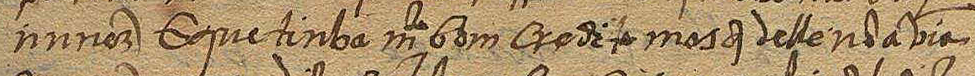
nunēz E que tinha mto bom credito mas q̄ delle nō avia
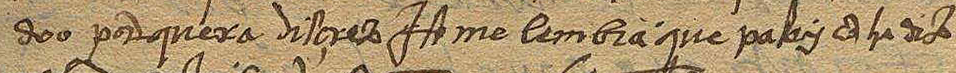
doo porquera discreto Jso me lembra que pasey cō ho dito
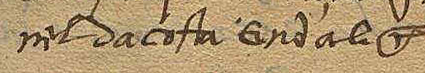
mel da costa End al c̄ꝭ
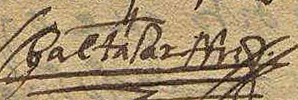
baltasar ffrz
